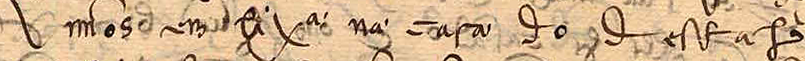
Anno̅s em lixa na casa do despacho
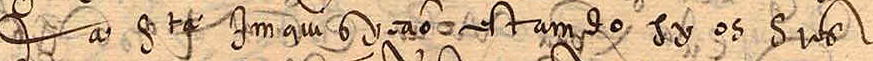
da Sta Jmquisyçaõ estamdo hy os Sres̄
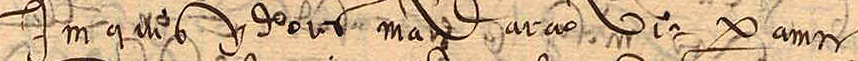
Jmquisydores mādaraõ Vir ꝑamte
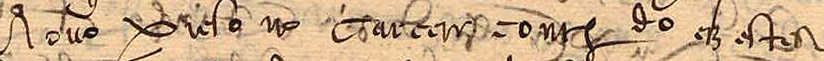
Nouo preso no carcere conthdo em estes
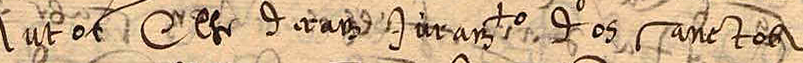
Autos e lhe deram Juramto dos sanctos
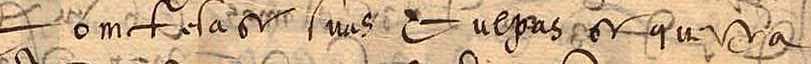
Comfesase suas Culpas se querya
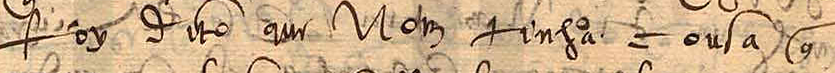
foy dit̅o que nom tinha cousa q̅
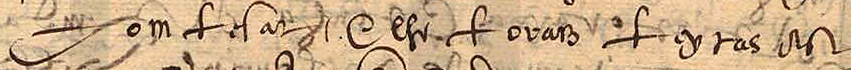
Comfesar /. e lhe foram feytas As
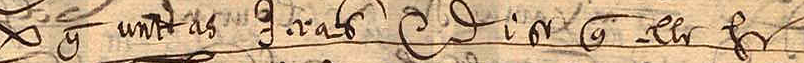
ꝑguntas geraes e dise q̅ elle he
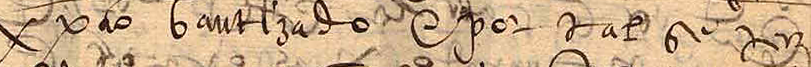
Xpaõ bautizado e por tal se tem
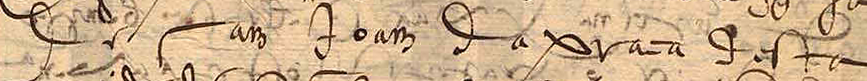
de sam Joam da Praca desta
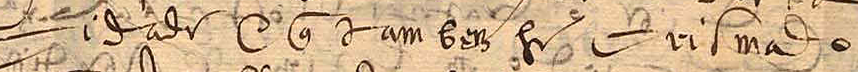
Cidade e q̅ tambem he crismado
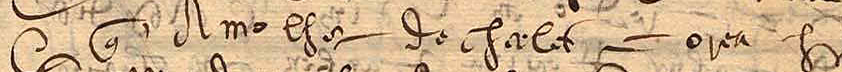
e q̅ A molher de charles corea he
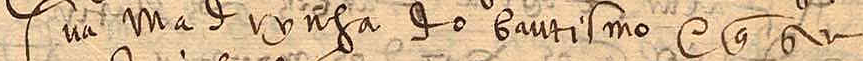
sua madrynha do bautismo e q̅ seu
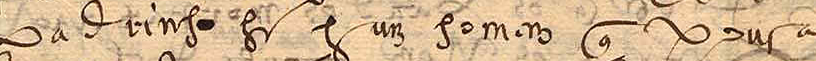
padrinho he hum homem q̅ pousa
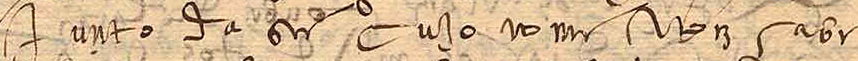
Junto da see cujo nome Nom sabe
